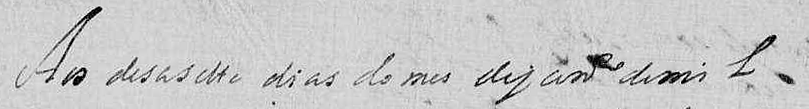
Aos desasette dias do mes de janro de mil
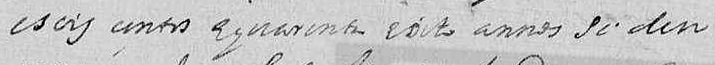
e seiscentos E quarenta E oito annos se deu
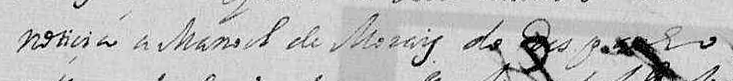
noticia a Manoel de Morais do despacho
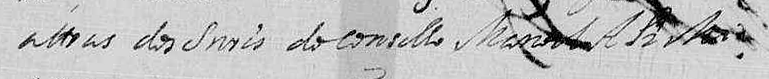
attras dos Snres̄ do conselho Manoel Alz̄ Mi
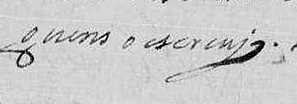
guens o escreuj.
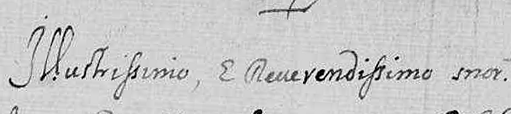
Illustrissimo, e Reuerendissimo snor̄.
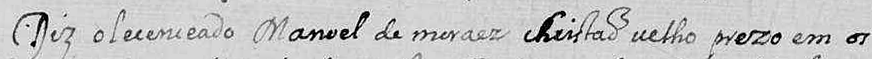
Diz o lecenceado Manoel de moraez christaõ uelho prezo em os
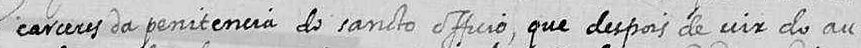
carceres da penitencia do sancto officio, que despois de uir do au
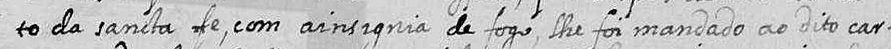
to da sancta fe, com a insignia de fogo, lhe foi mandado ao dito car
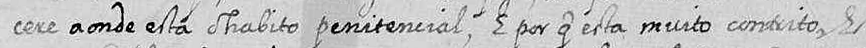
cere aonde está o habito penitencial, E porq̄ esta muito contrito, E
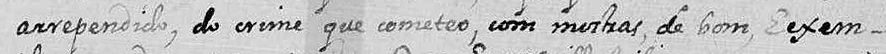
arrependido, do crime que cometeo, com mostras de bom, E exem
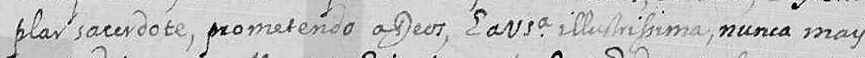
plar sacerdote, prometendo a Deos, E a v s.a illustrissima, nunca mais
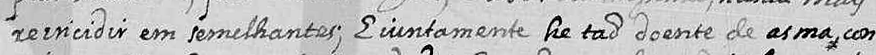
reincidir em semelhantes; E iuntamente he taõ doente de asma con
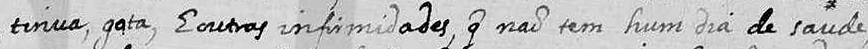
tinua, gota, E outras infirmidades, q̄ naõ tem hum dia de saude,
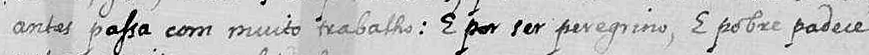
antes passa com muito trabalho: E por ser peregrino, E pobre padece
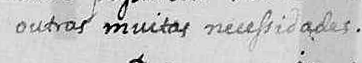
outras muitas necessidades.
